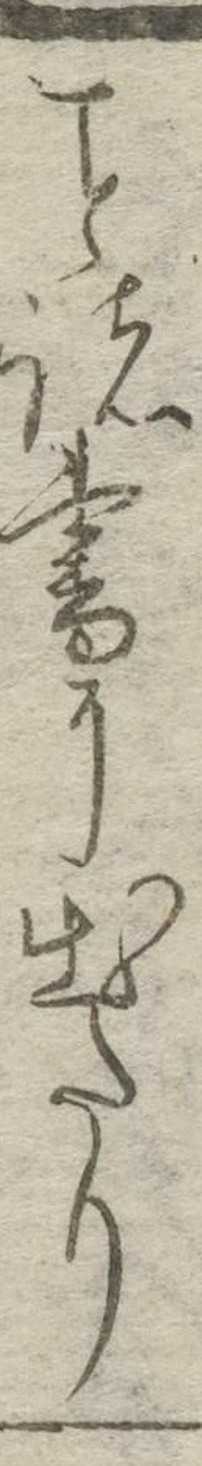こと諸書に出たり
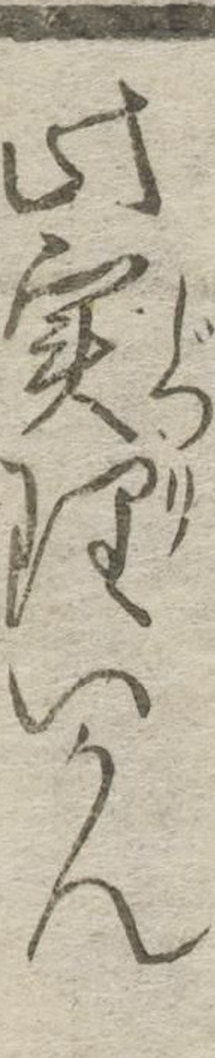此実理いかん
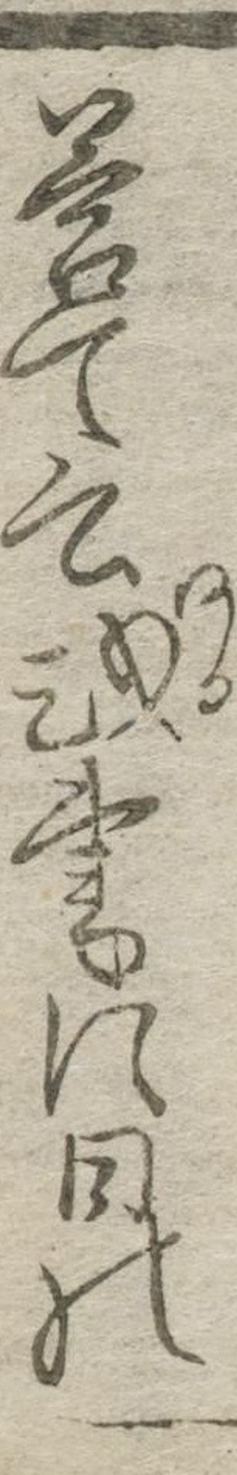答て云或書に日の
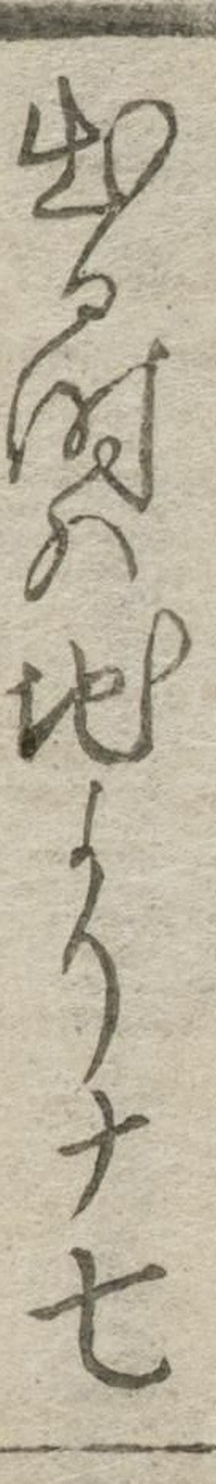出る時は地より十七
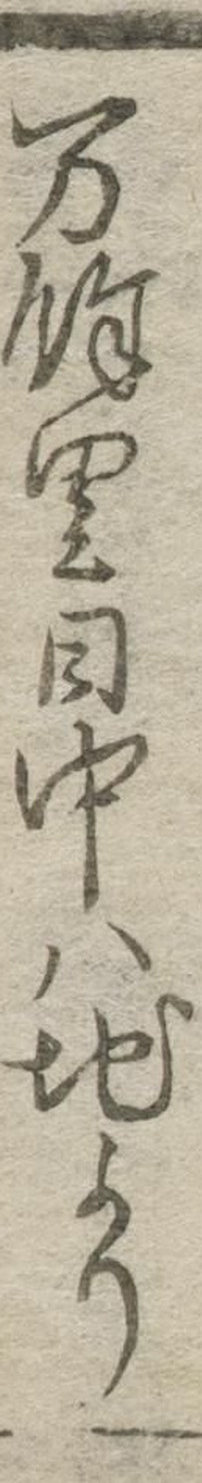万余里日中は地より
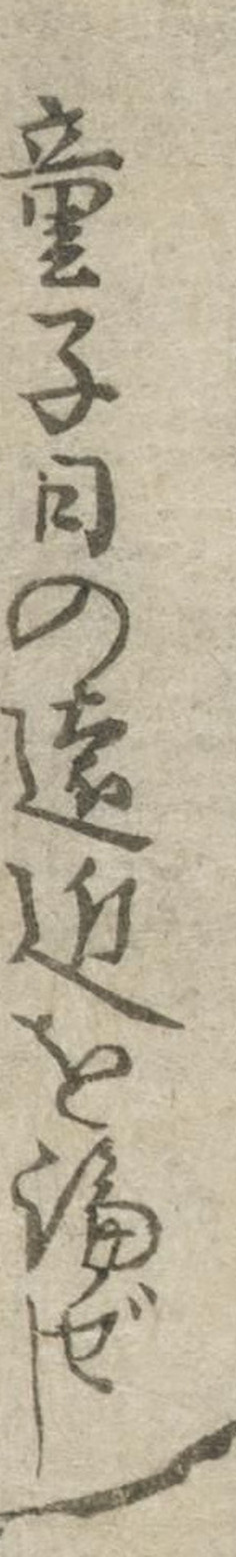童子日の遠近を論ぜし
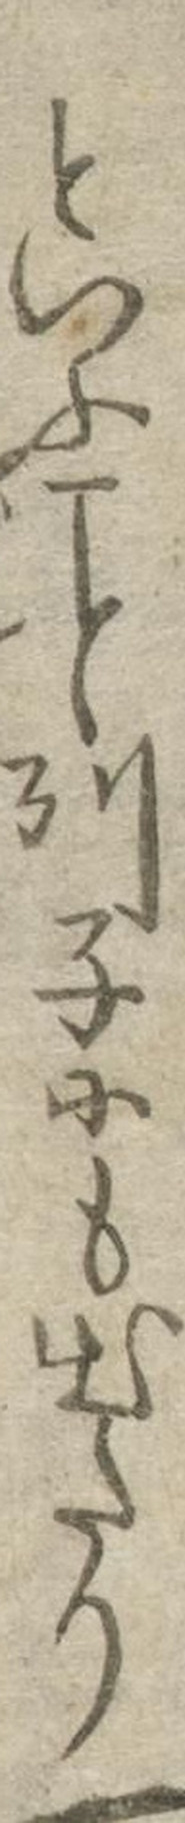といふこと列子にも出たり
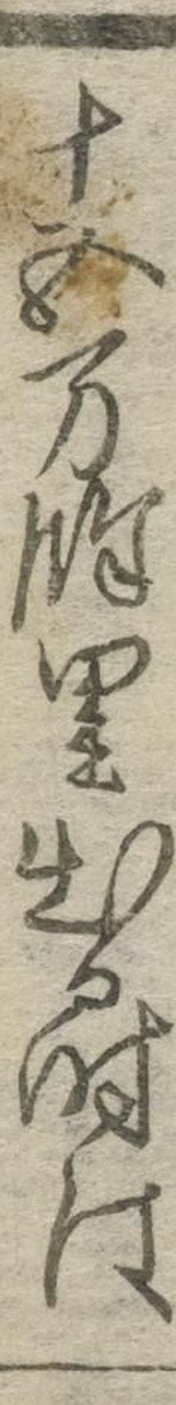十五万余里出る時は
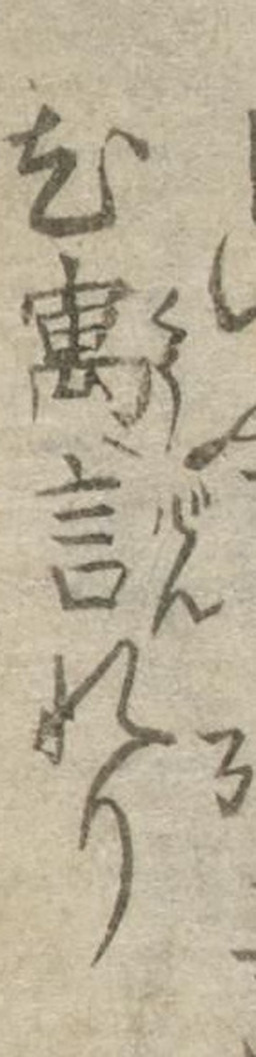尤寓言なり
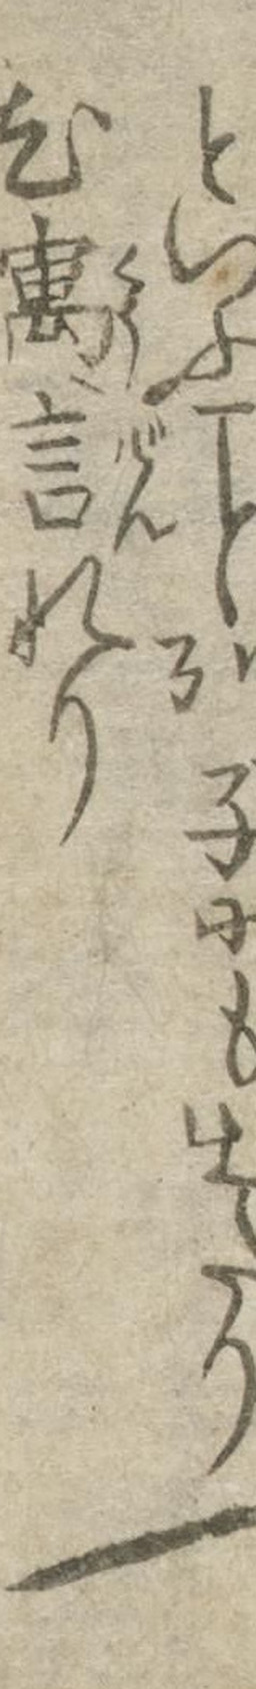尤寓言なり

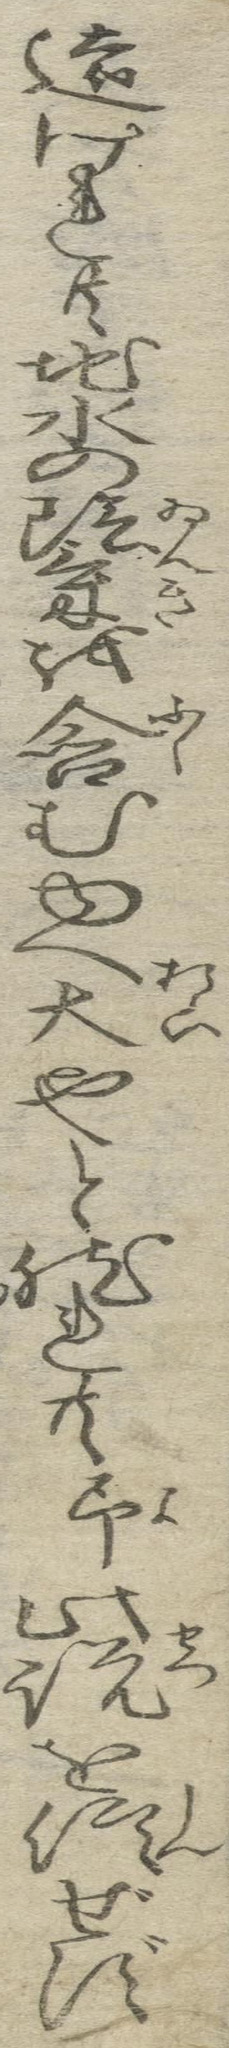遠けれ共地水の陰気を含むゆへ大やと然れ共予此説を信ぜず
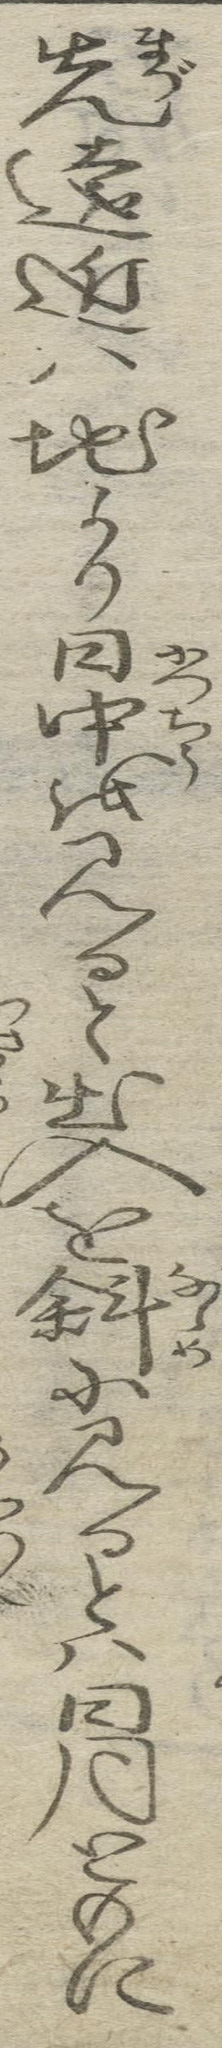先遠近は地より日中を見ると出入りを斜に見るとは日月ともに
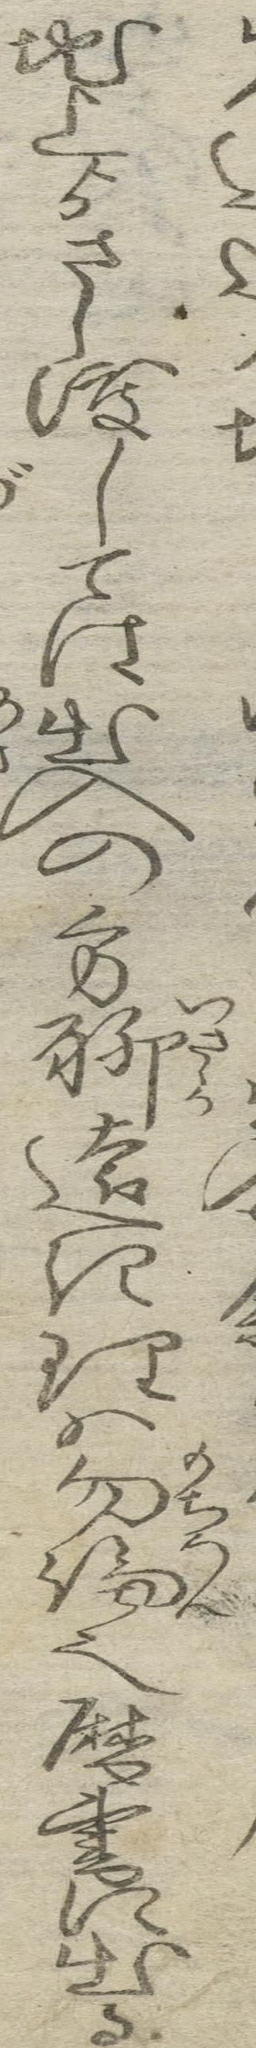地上ゟさし渡しては出入の方聊遠き理は勿論也暦書に出る
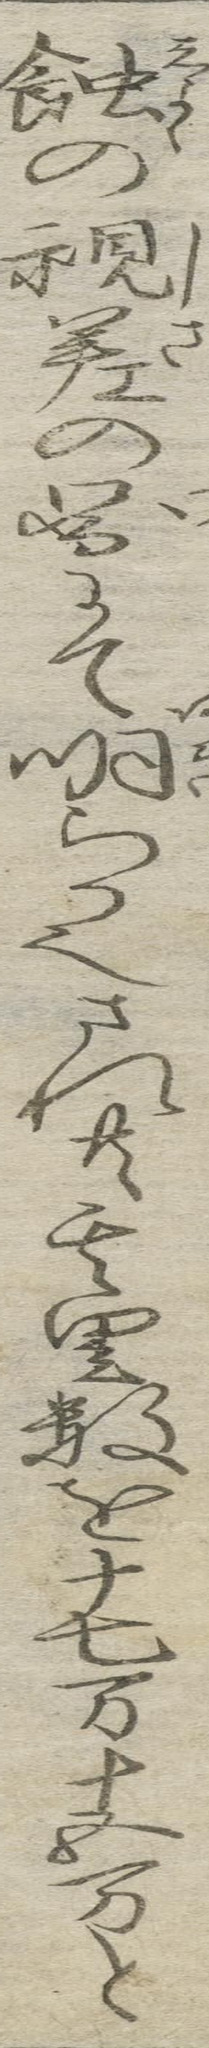触の視差の図にて明らか也され共其里数を十七万十五万と
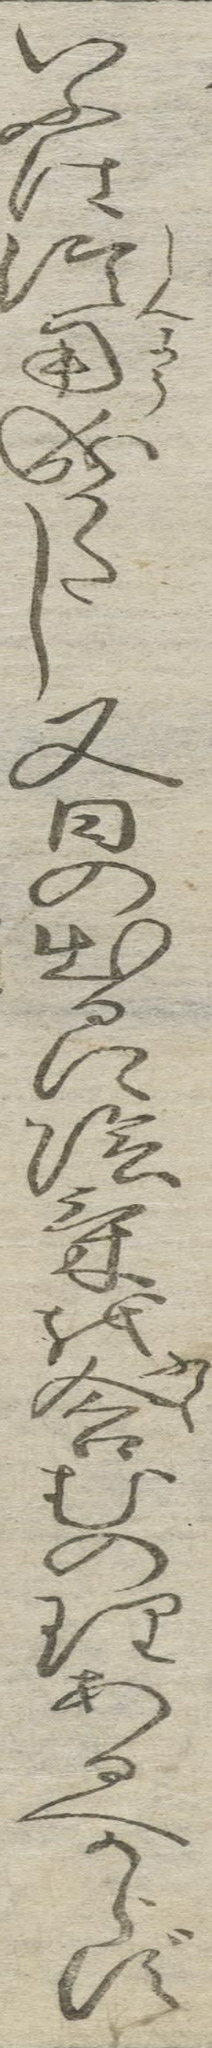いふは信用成かたし又日の出るに陰気を含むの理あるへからず
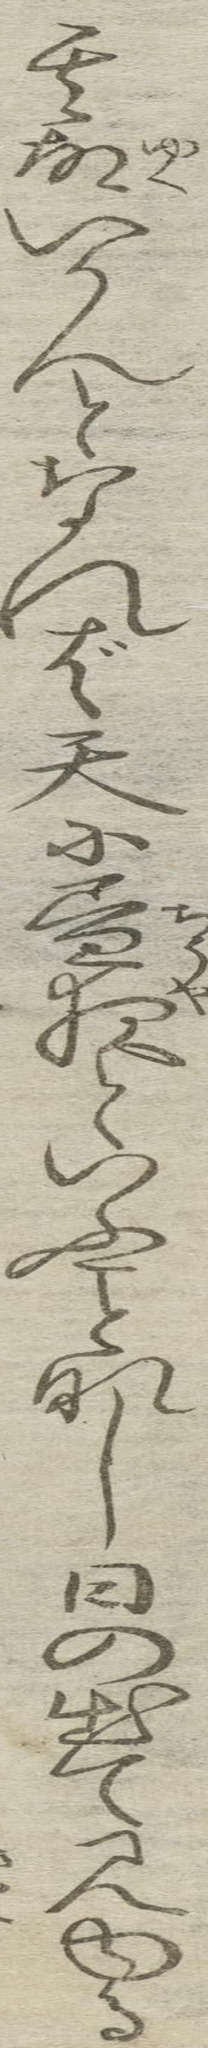其故いかんとなれば天に昼夜といふことなし日の出て見ゆる
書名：訓蒙天地辨　天
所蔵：東京大学地震研究所図書室 Earthquake Research Institute Library, The University of Tokyo, JAPAN
